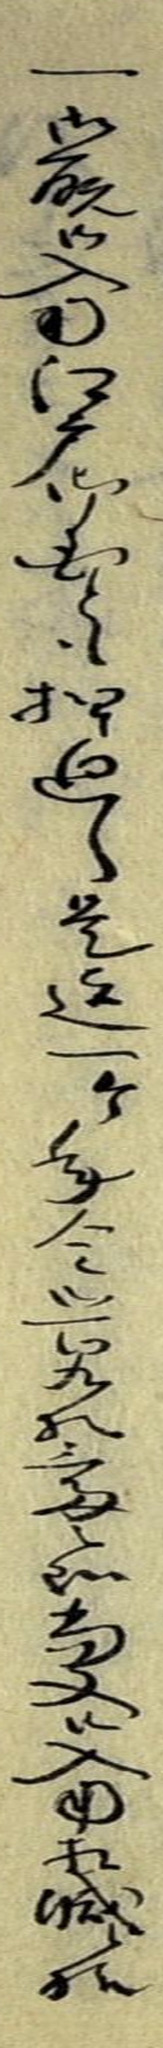一御殿御入用江戸御国とも押廻し是迄一ケ年金弐百九拾三両之処尚又御入用相減候様
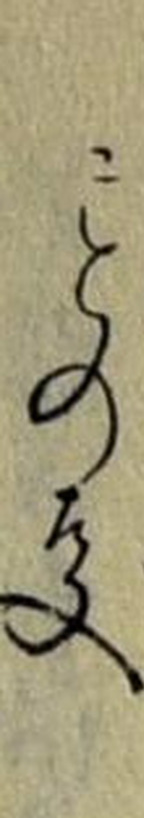にとの事
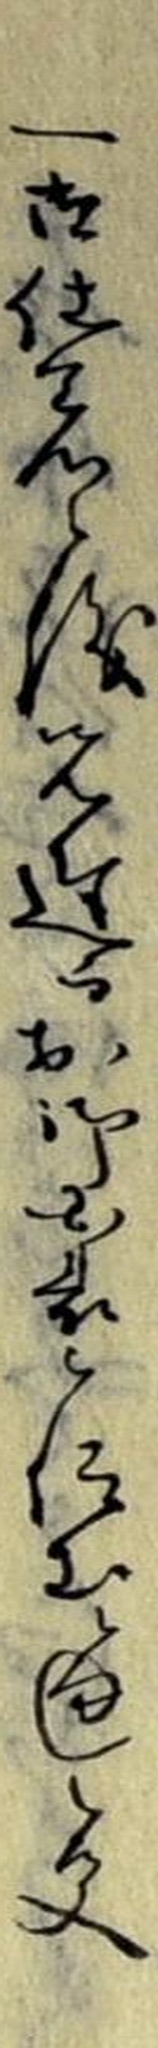一御仕着之儀先達而於御国表被仰出候通之事
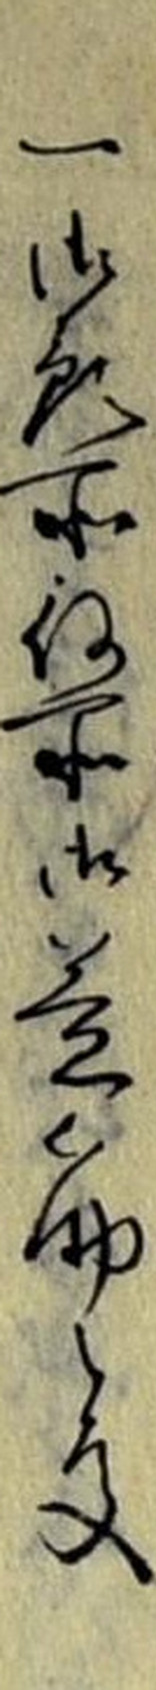一御預所役所御益筋之事
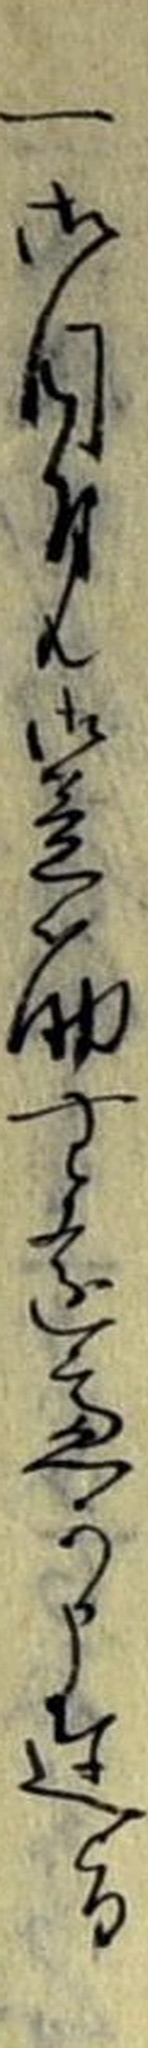一御目付共御益筋無遠慮可申達旨
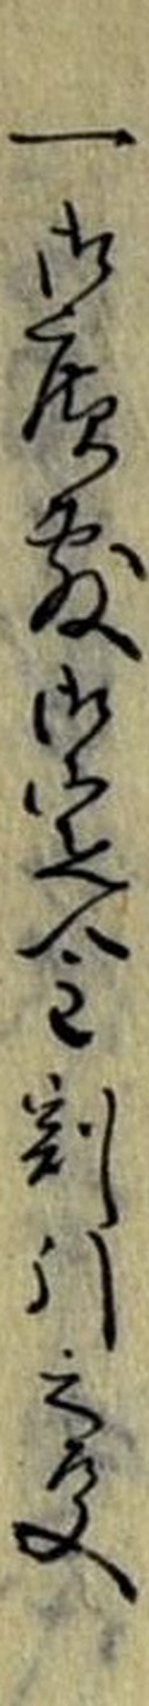一御広敷御定金割引之事
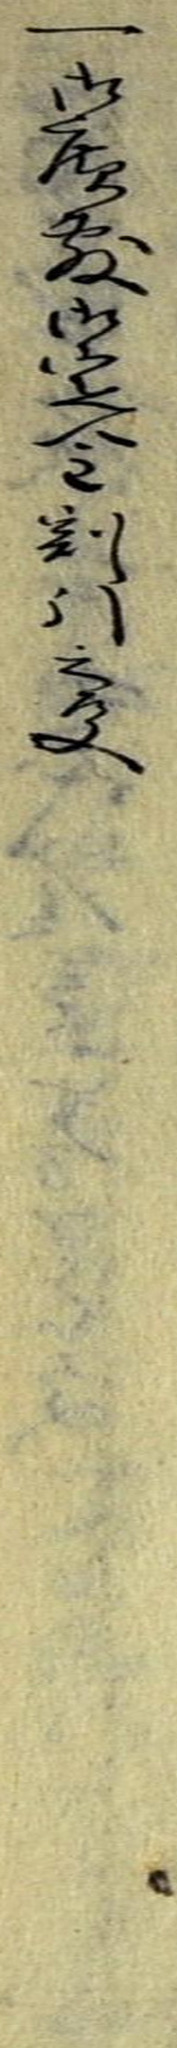一御広敷御定金割引之事

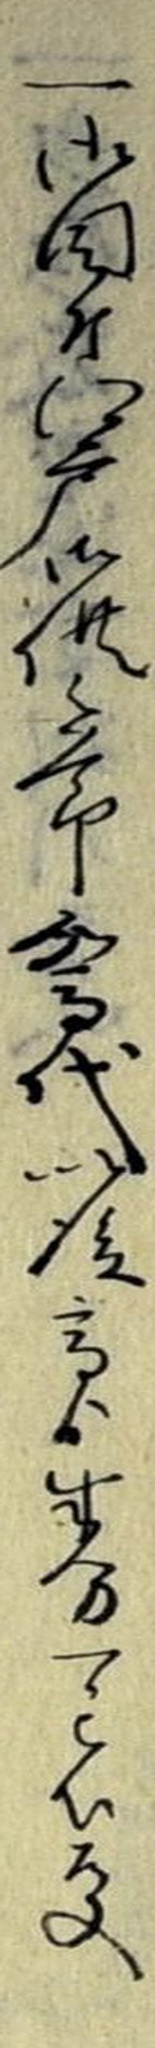一御目付江戸御供之節駕代以後高ゟ半分可被下事
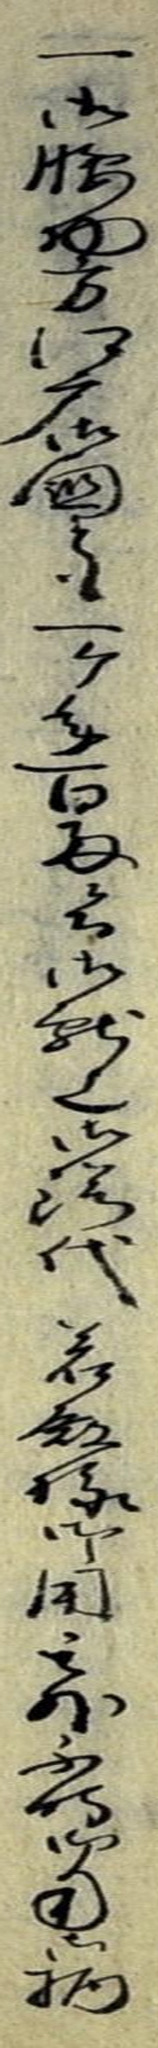一御腰物方江戸御国とも一ヶ年百両に而御献上御代若殿様御用其外不時御用御柄
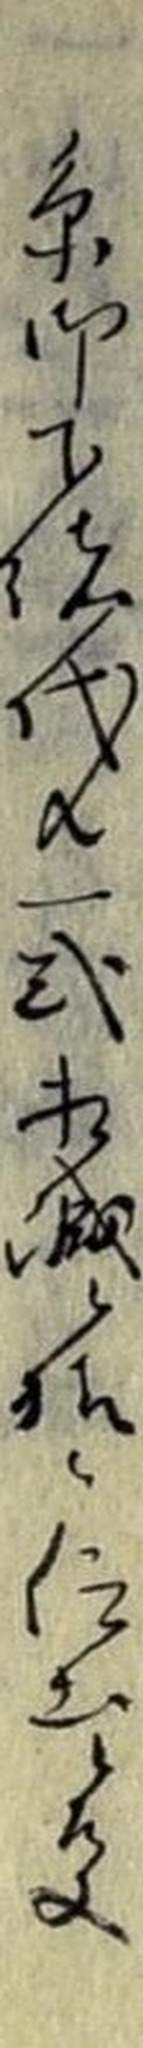糸御下緒代共一式相減候様被仰出候事
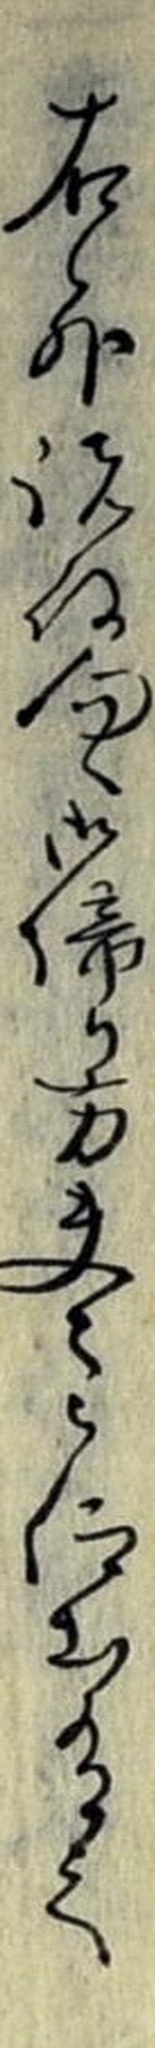右之外諸役向へ御締り方夫々被仰出有之
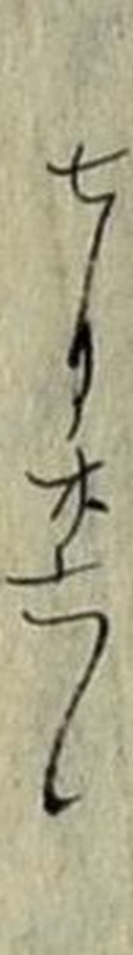七月廿六日
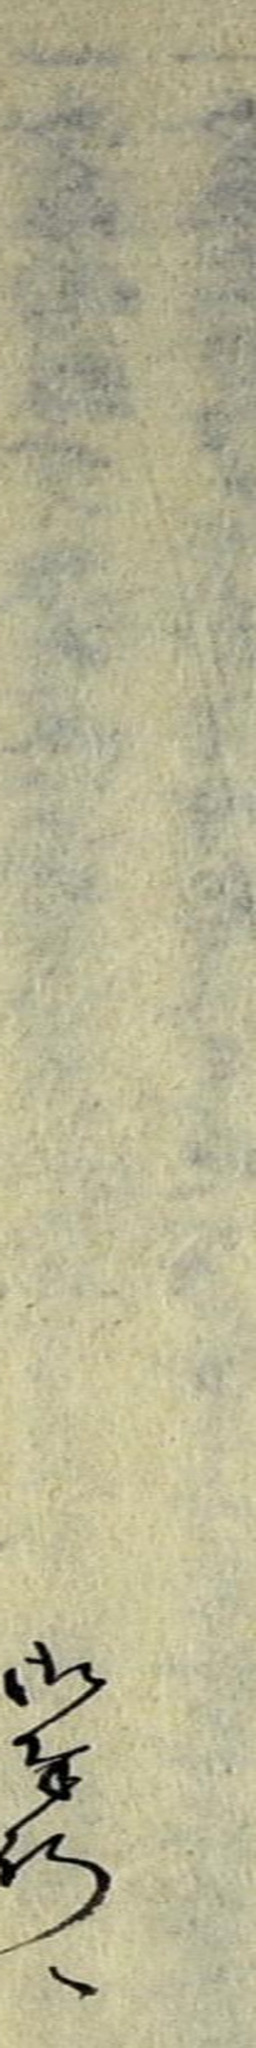御奉行へ
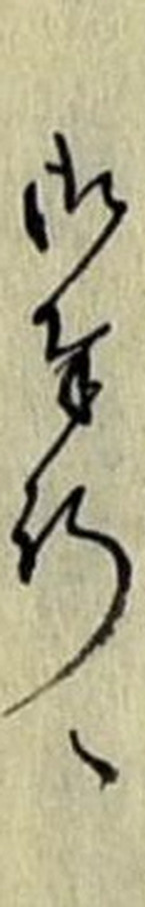御奉行へ
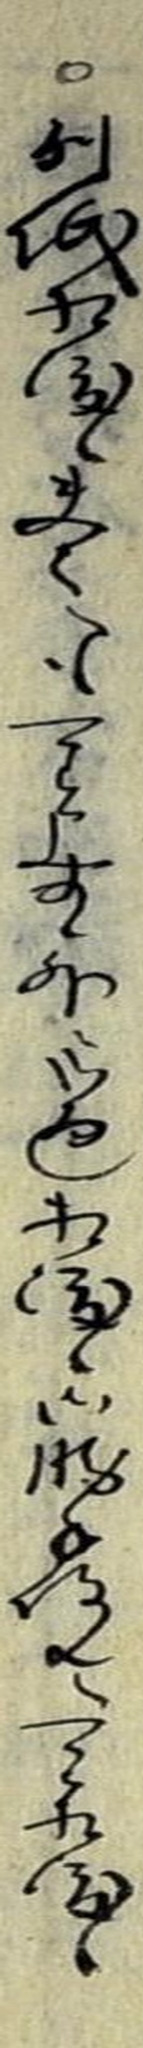〇別紙相渡候夫々へも可被申聞候外に弐通相渡候御勝手役共へ可被相渡候
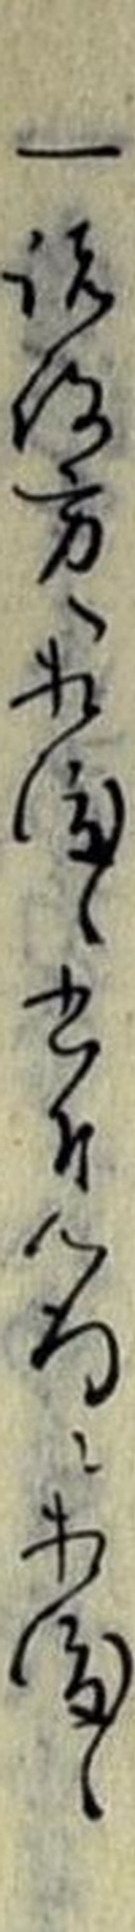一諸役方へ相渡候書付心得に相渡候
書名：命令之部 二
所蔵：福井県文書館 Fukui Prefectural Archives
